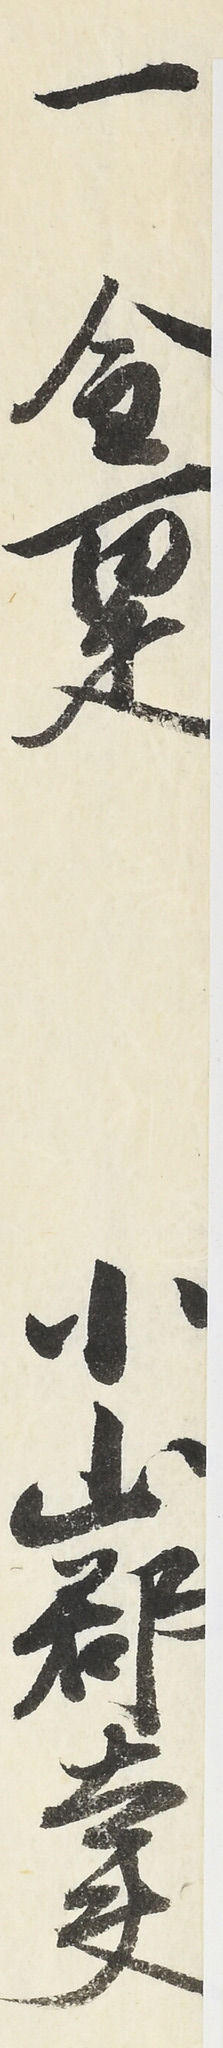一金百疋小山郡太夫

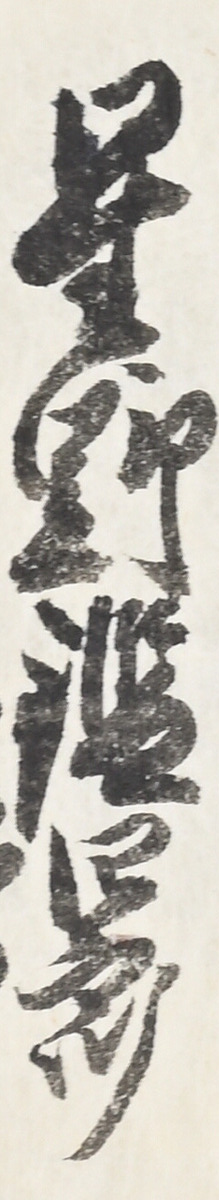星野鑑四郎
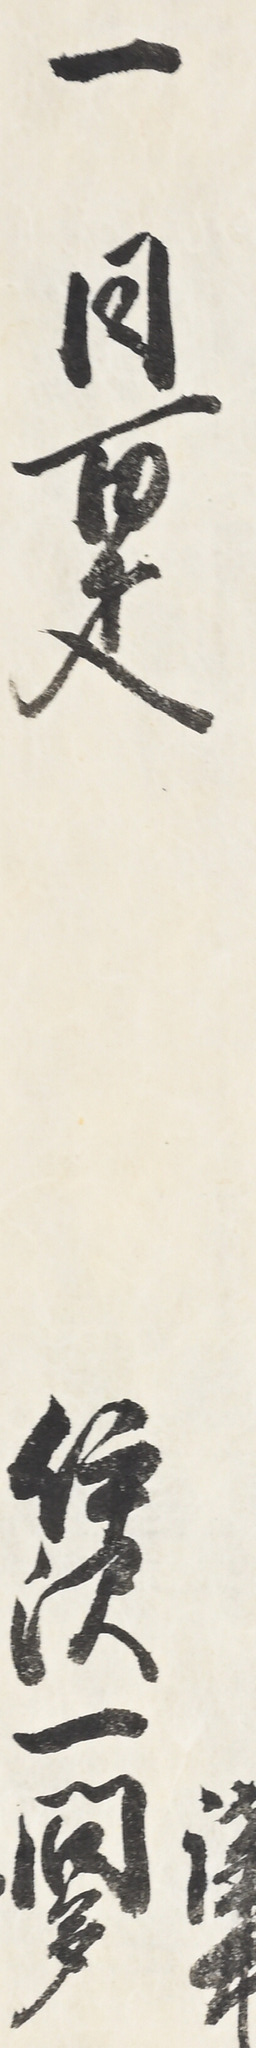一同百疋伊沢一問多
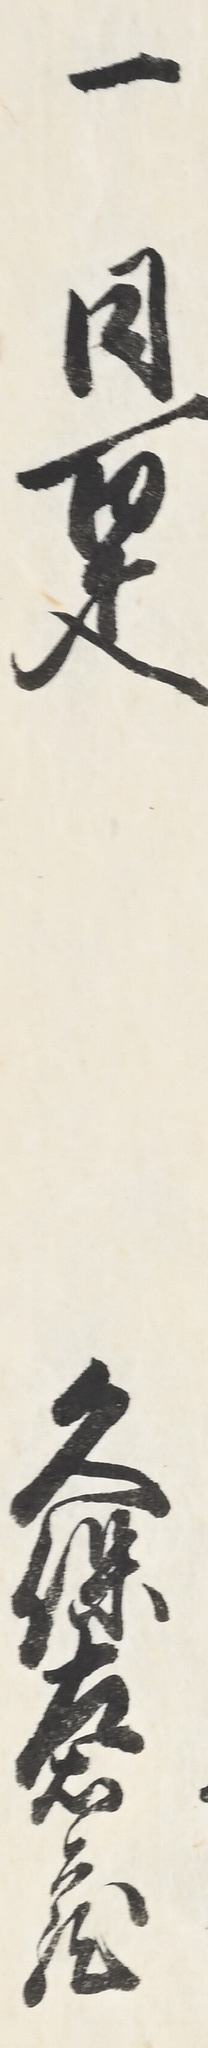一同百疋久保左右蔵

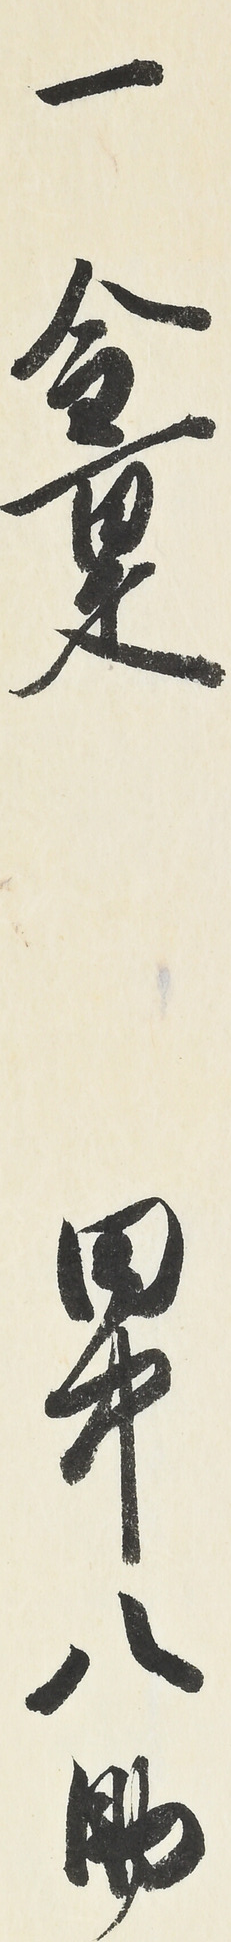一金百疋田中八助
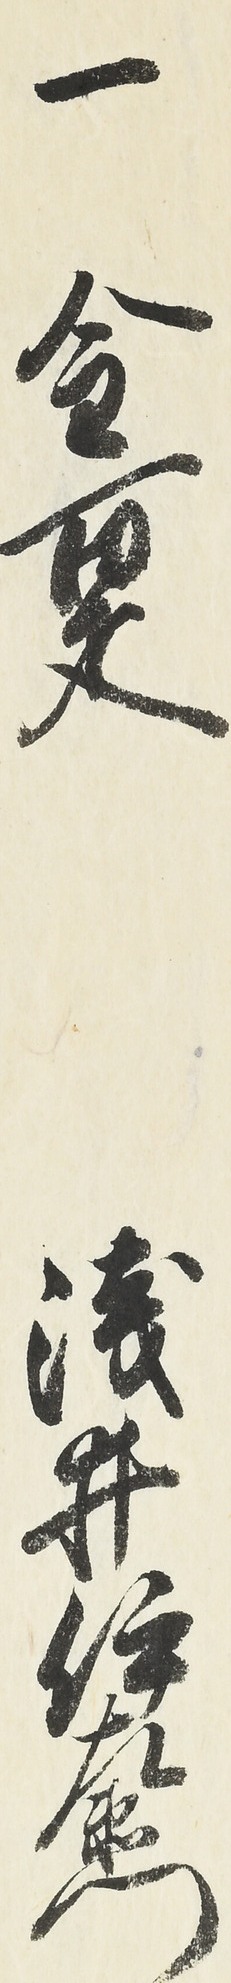一金百疋浅井伊左衛門
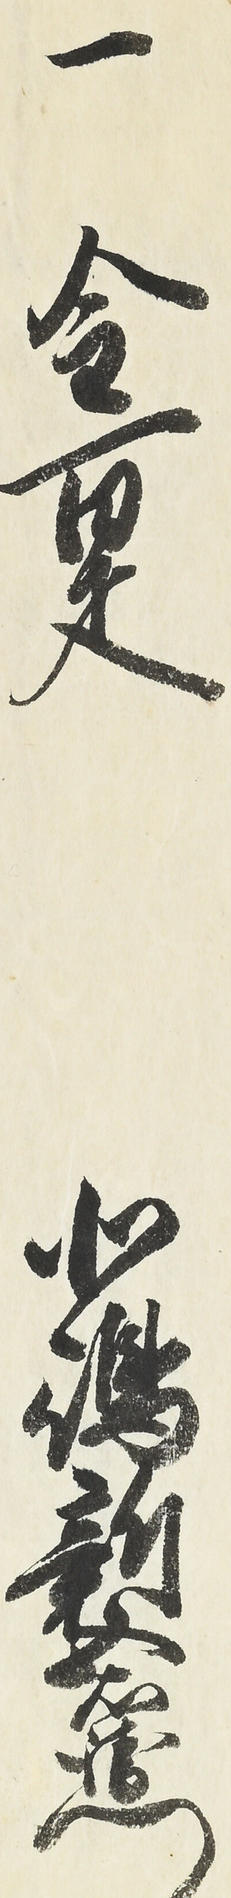一金百疋北嶋新五右衛門
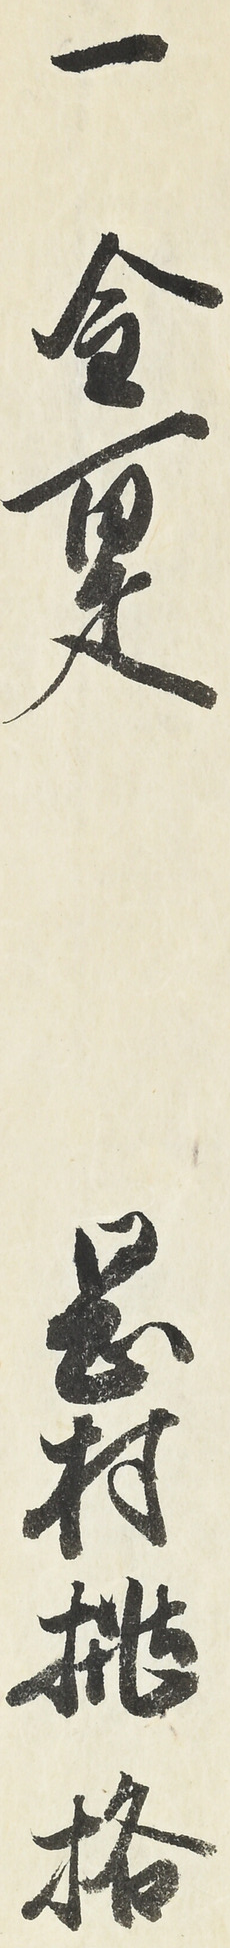一金百疋岡村挑格

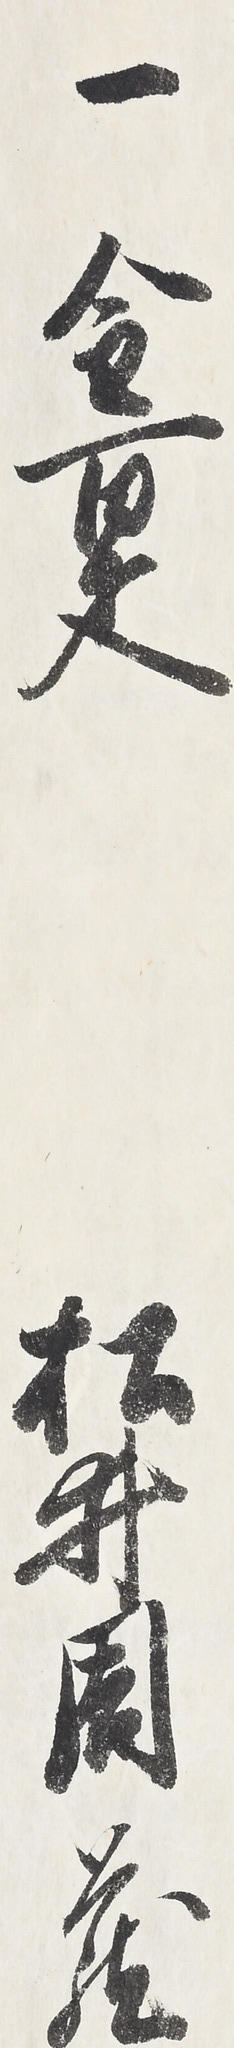一金百疋松井周蔵
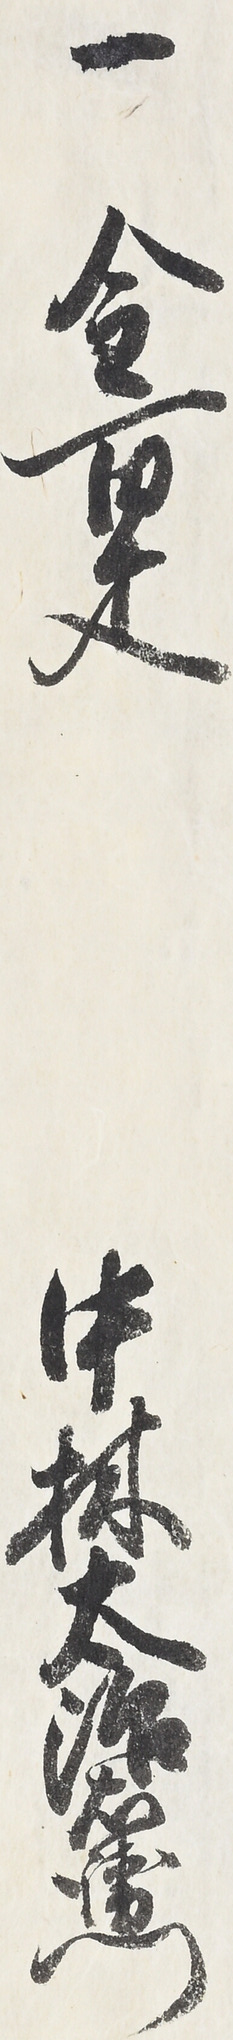一金百疋中林太治右衛門
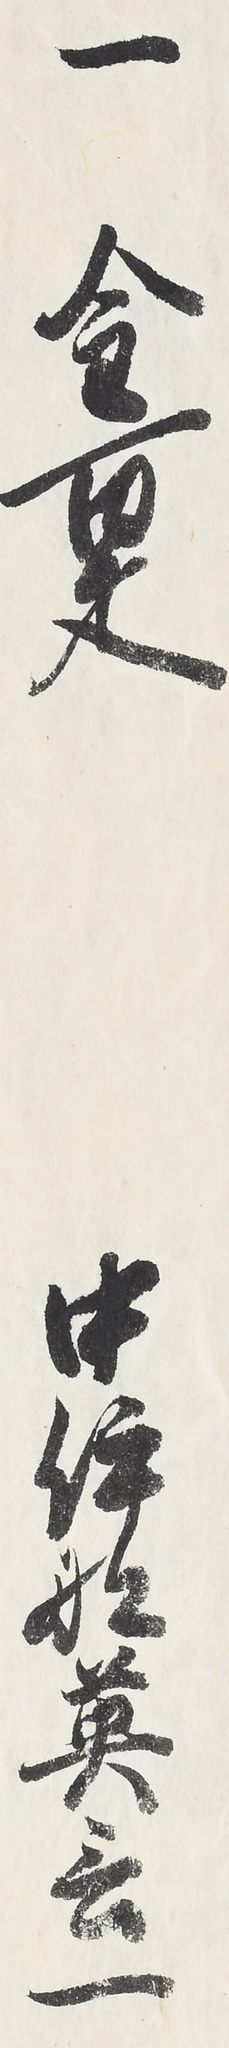一金百疋中伊那英言一
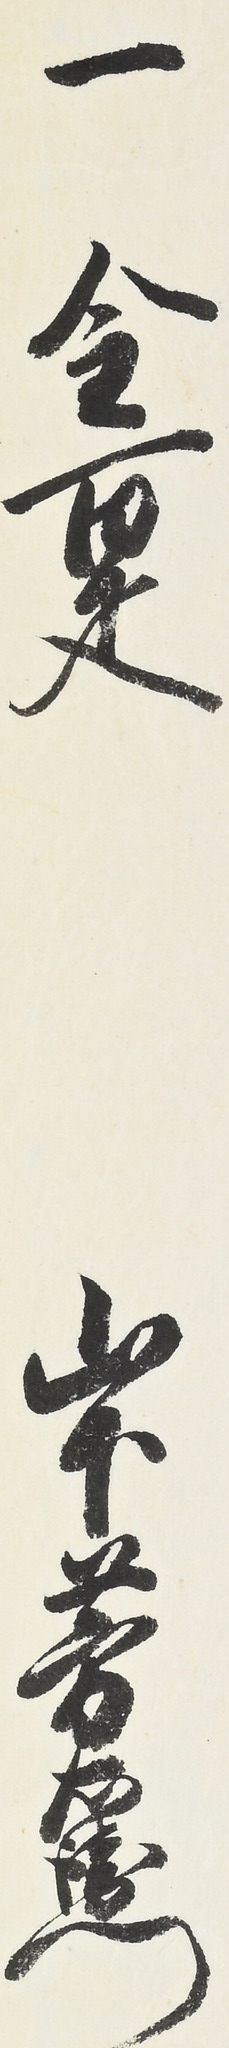一金百疋山下芳右衛門
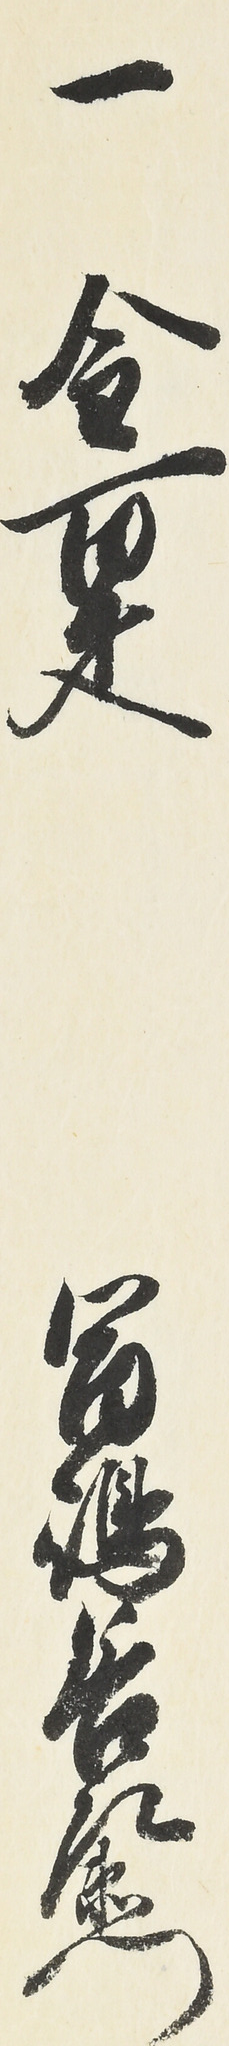一金百疋冨嶋善左衛門
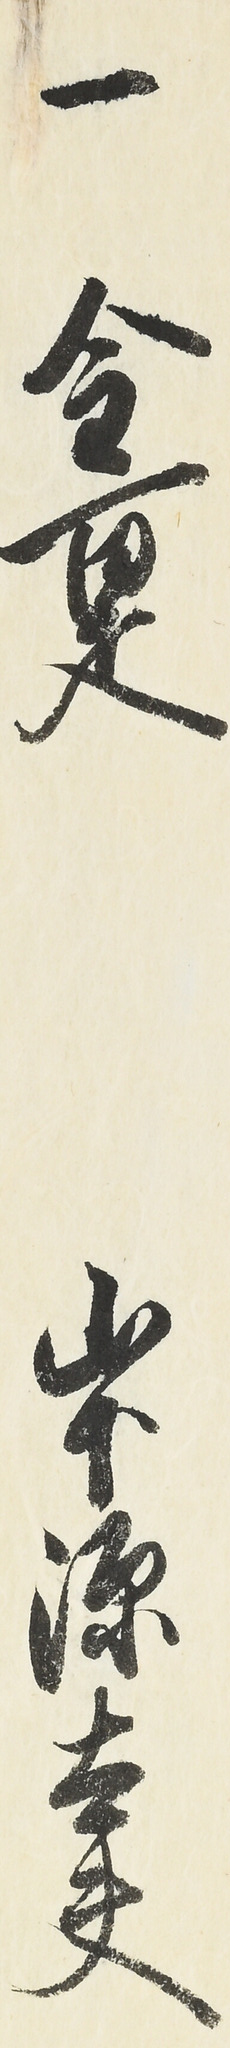一金百疋山下源太夫
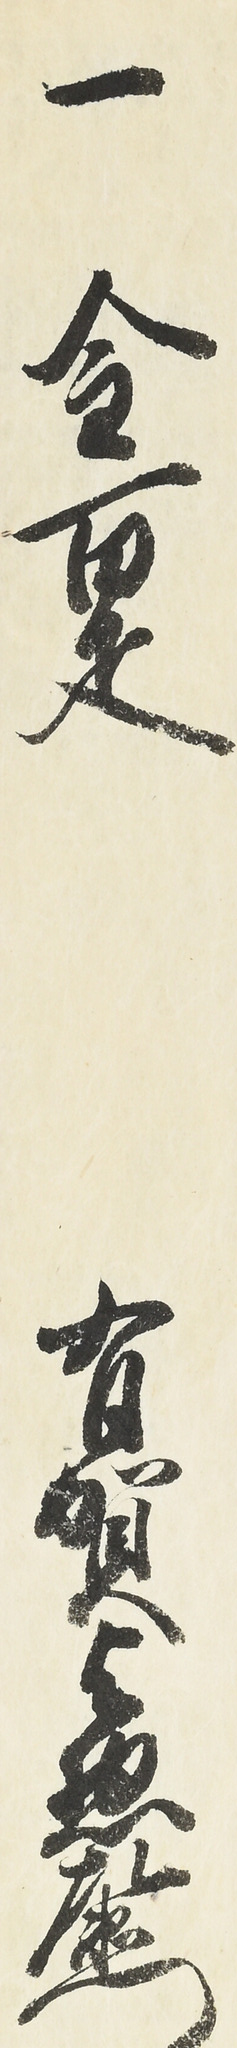一金百疋有賀与惣左衛門
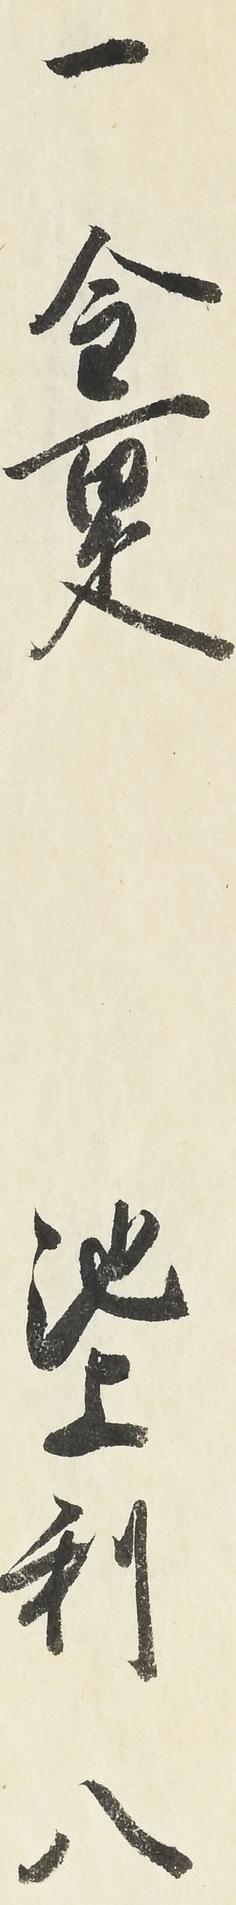一金百疋池上利八
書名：永代太々御神楽名前帳
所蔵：伊那市立高遠町図書館・合同会社AMANE
